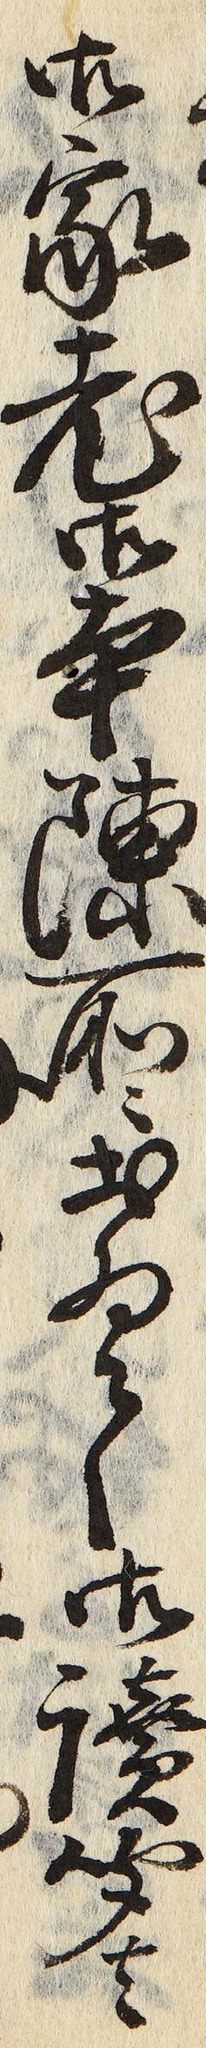御家老御本陣所ニおゐて御読聞者
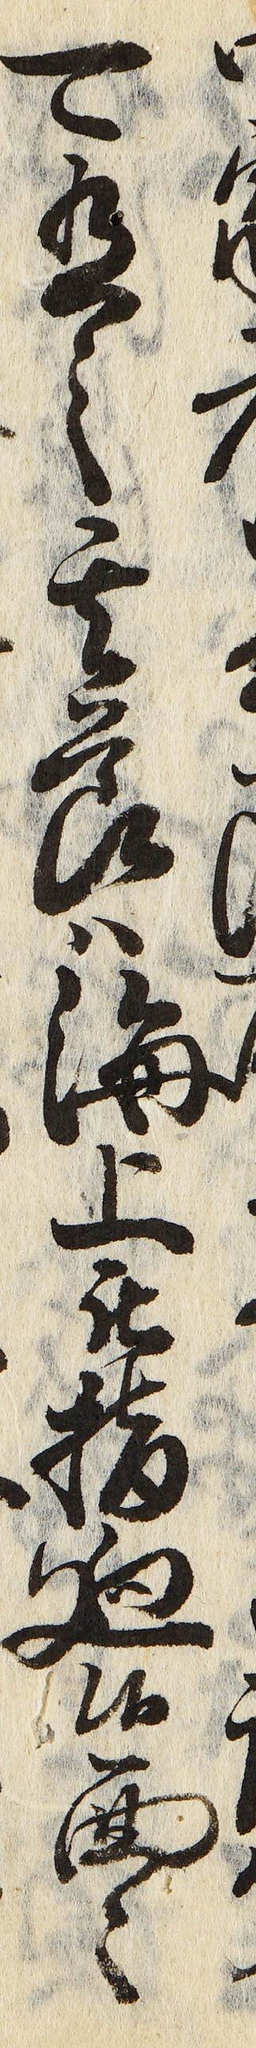可有之其節ハ海上被指廻候面々
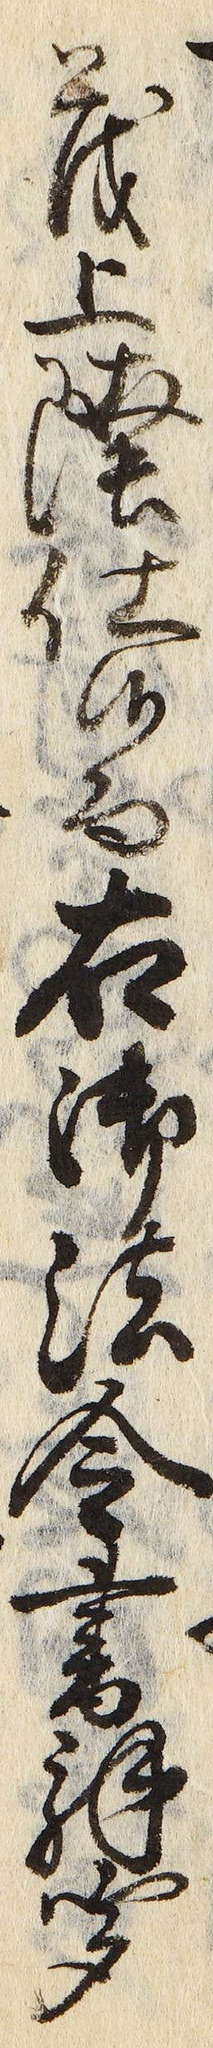も上陸仕候而右御法令書拝聞
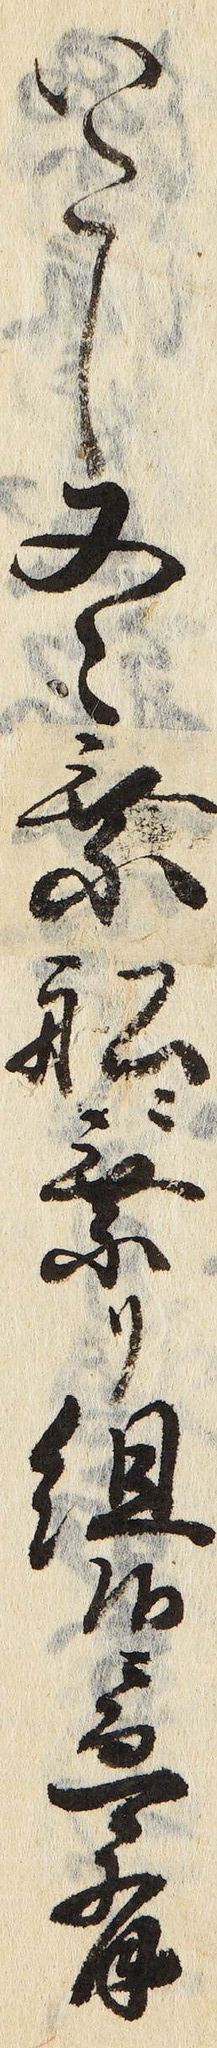いたし又々乗船ニ乗り組候ニ而可有
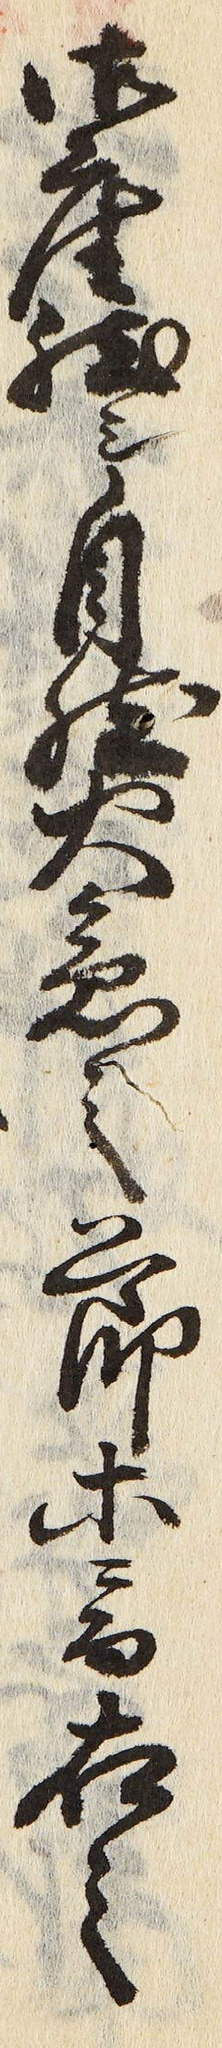御座然シ自然火急之節等ニ而右之
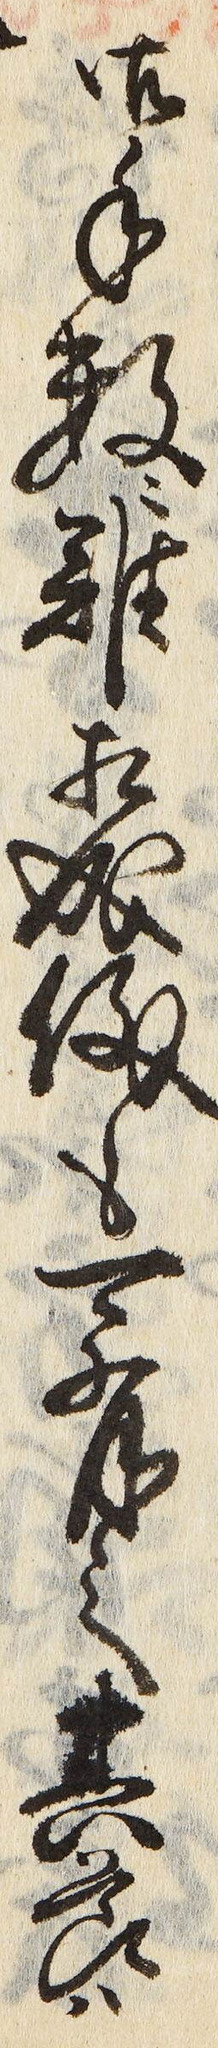御手数ニ難相成儀も可有之其節ハ
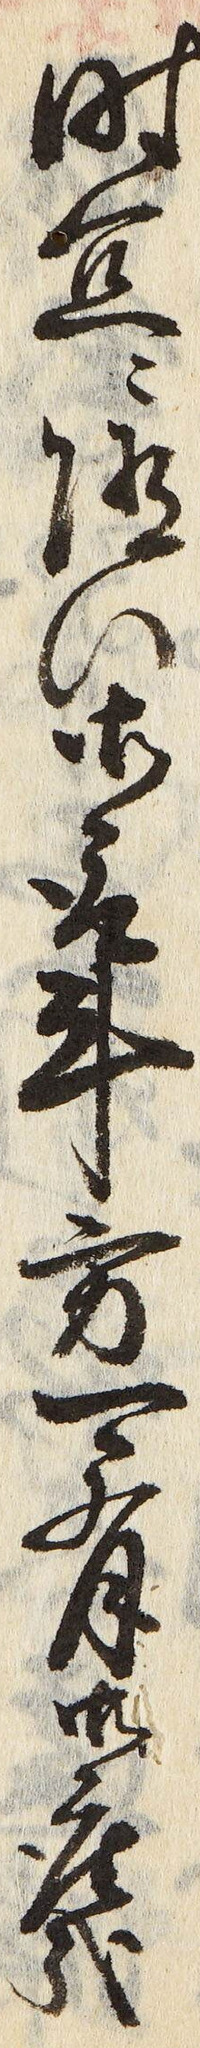時宜ニ随い御取計方可有御座哉
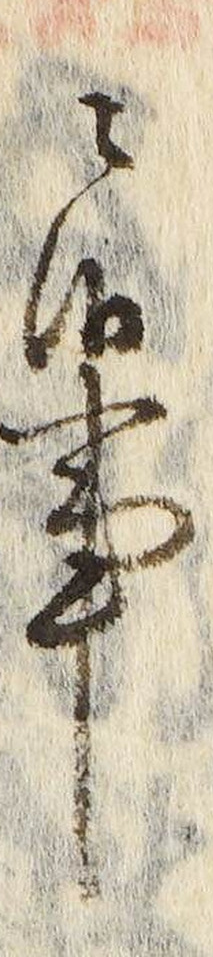ニ候事
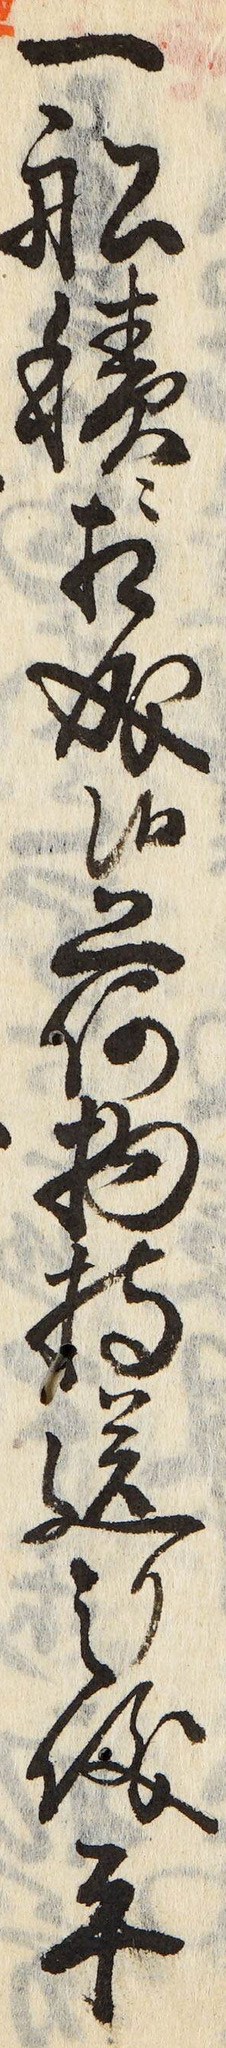一船積ニ相成候荷物持送り之儀平
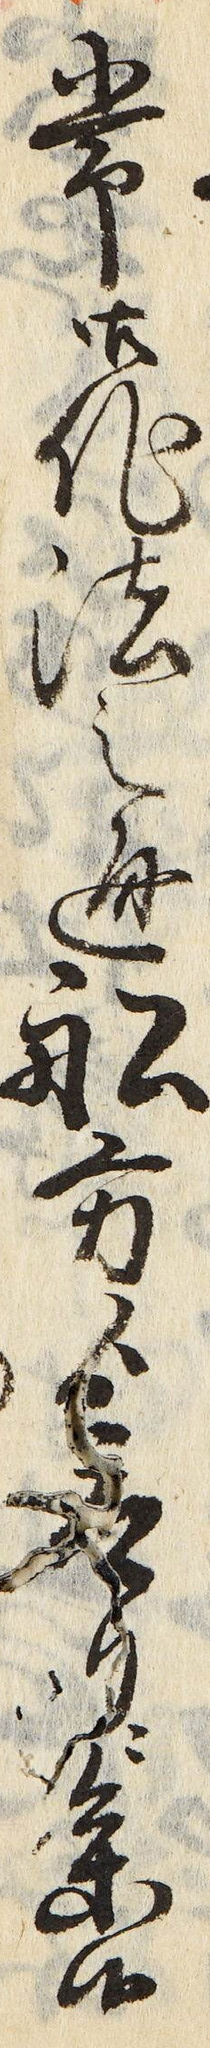常御作法之通船方ゟ取りニ参候
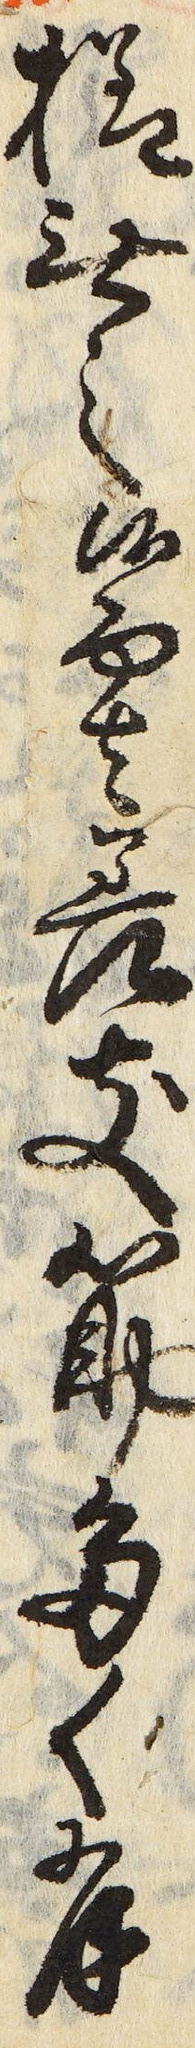様無之候而者差支筋多く有

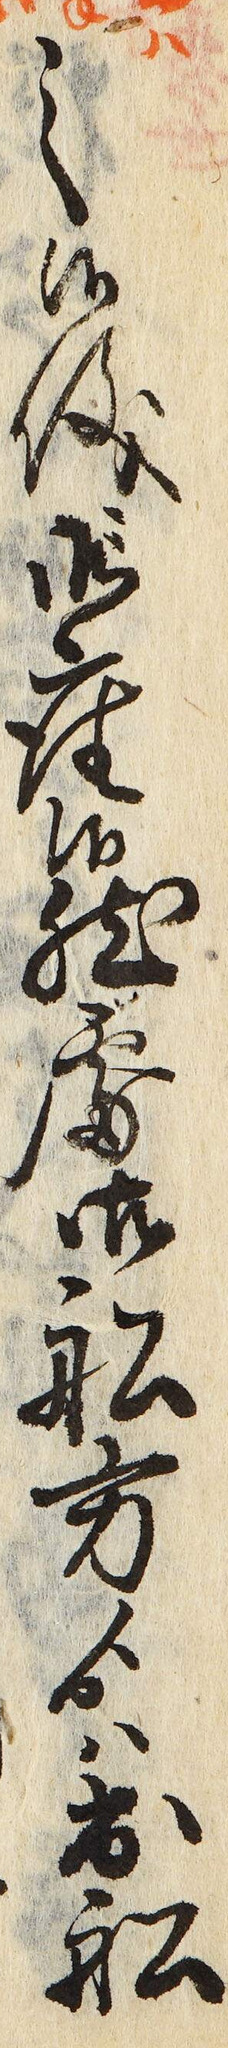之候儀ニ御座候然処船方ゟハ出船
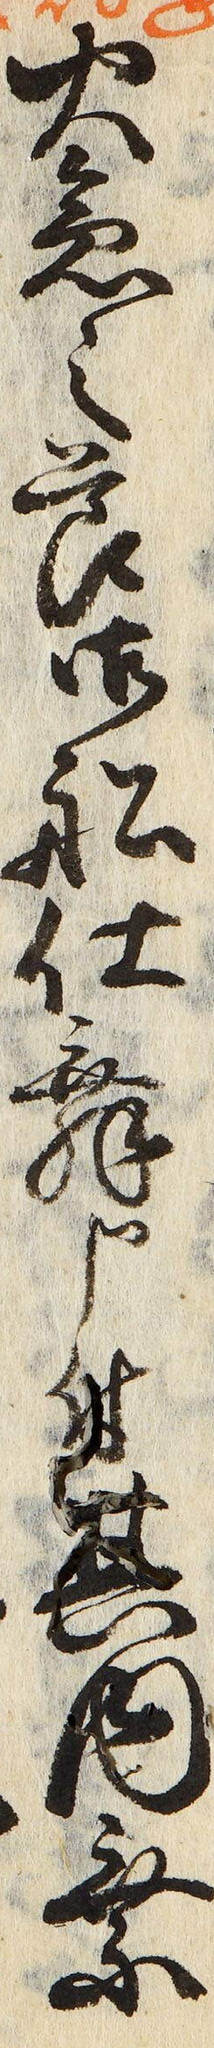火急之節御船仕舞申付其内乗
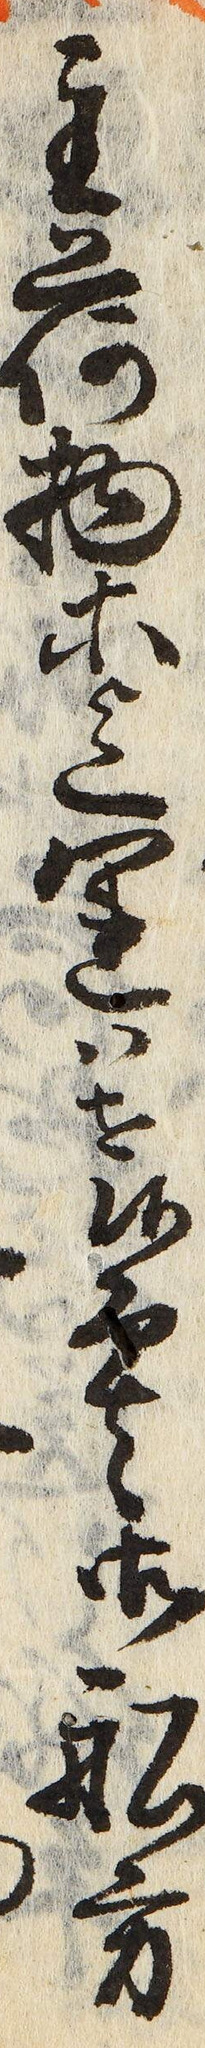主荷物等迄運ハせ候而者御船方
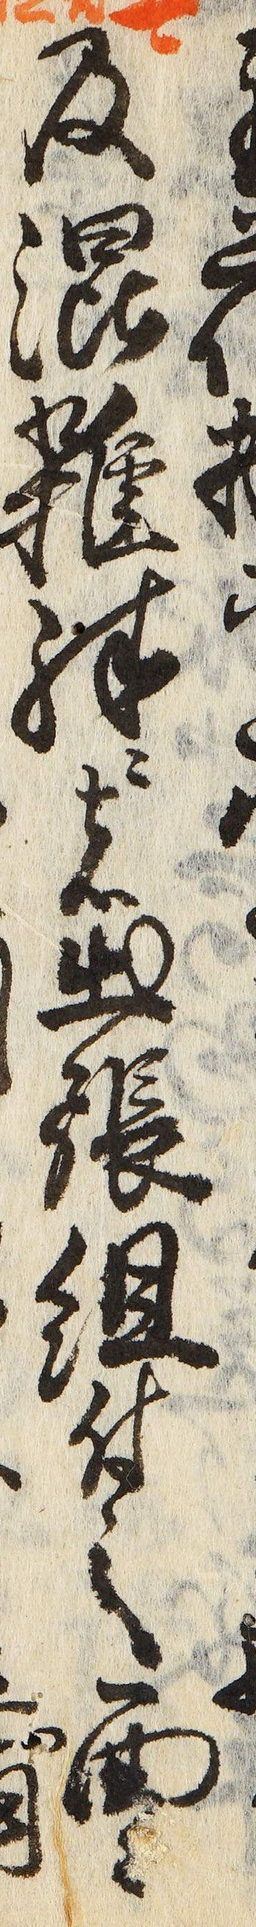及混雑殊ニ者出張組付之面々
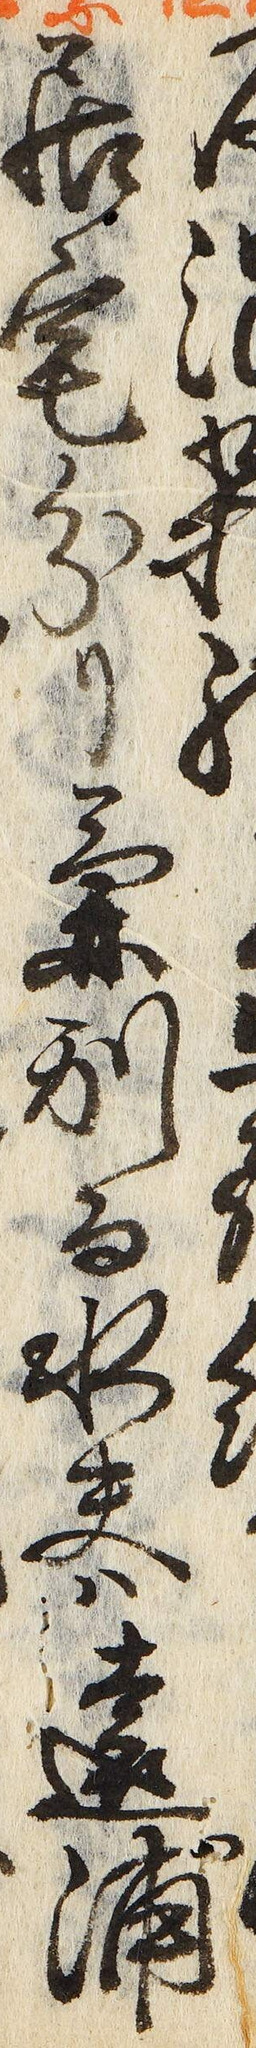居宅分り兼別而水夫ハ遠浦
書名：御領海江異国船漂流有之節御手当之次第大組頭心得之廉々書集記
